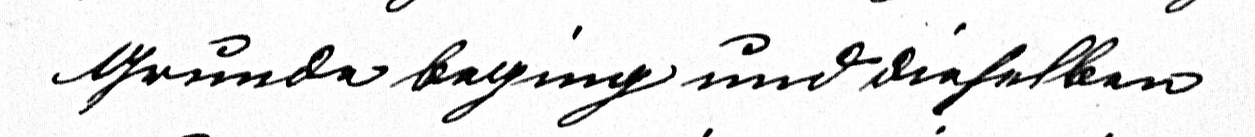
Grunde beging und dieselben
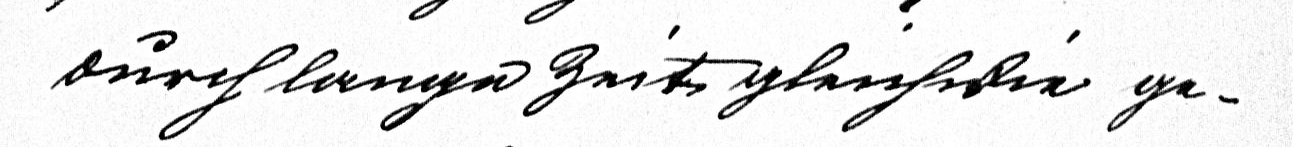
durch lange Zeit gleichwie ge¬
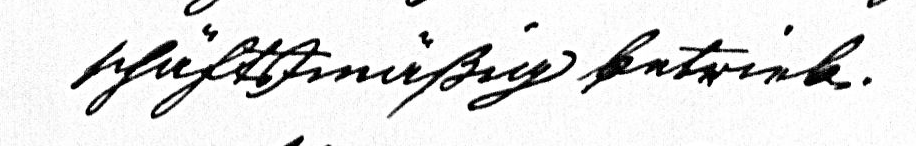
schäftmäßig betrieb.
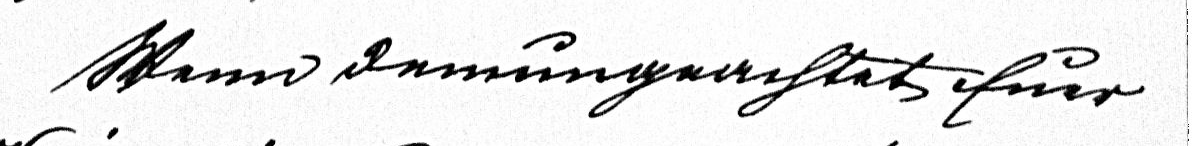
Wenn Demungeachtet Euer
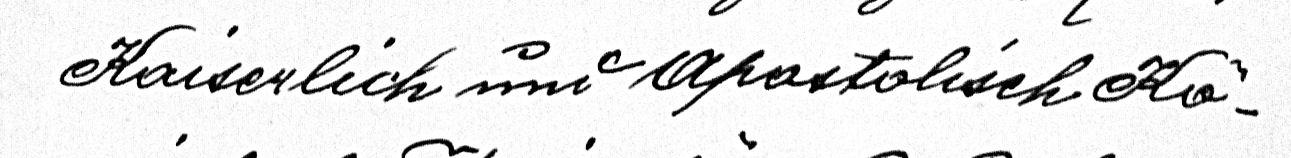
Kaiserlich und Apostolisch Kö¬
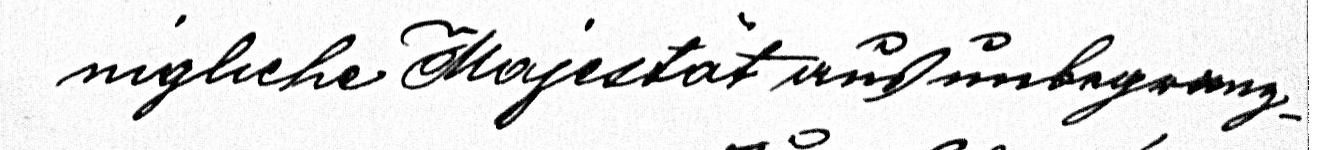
nigliche Majestät aus unbegrenz¬
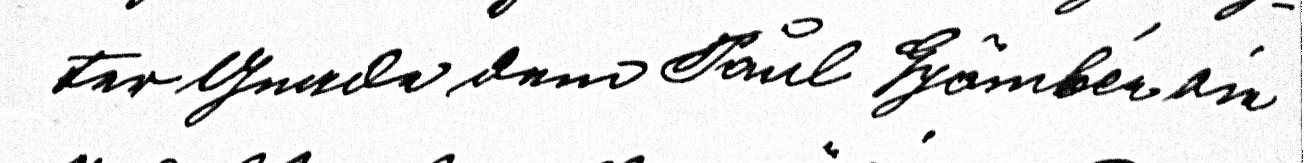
ter Gnade dem Paul Gyömbér die
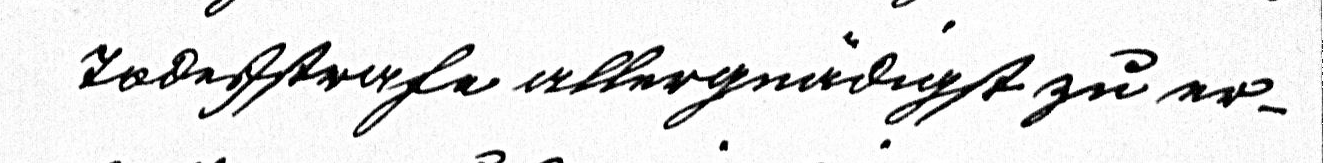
Todesstrafe allergnädigst zu er¬
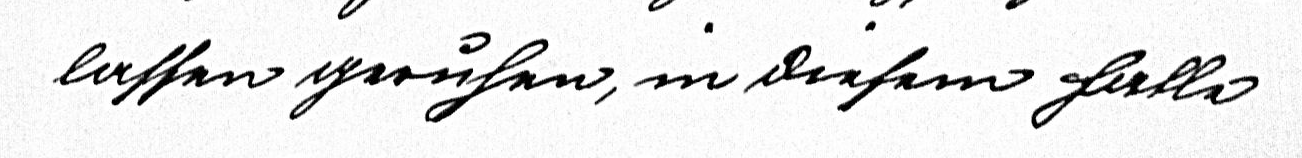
lassen geruhen, in diesem halle
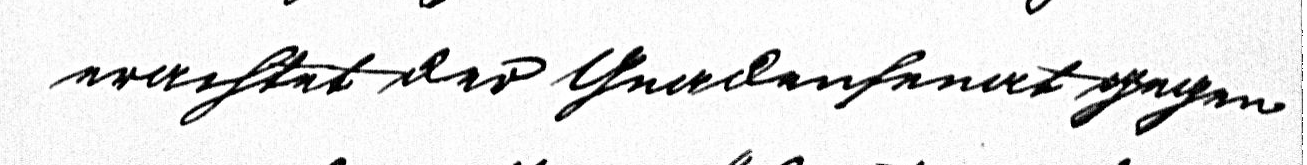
erachtet der Gnadensenat gegen
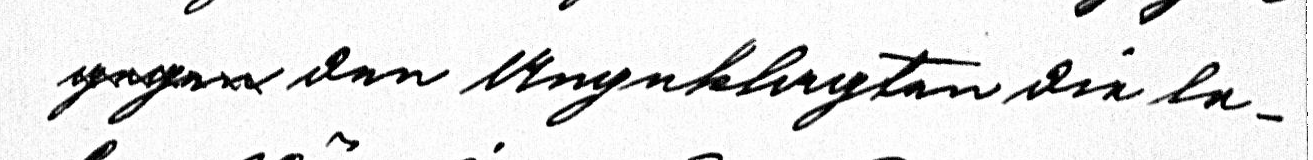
den Angeklagten die le¬
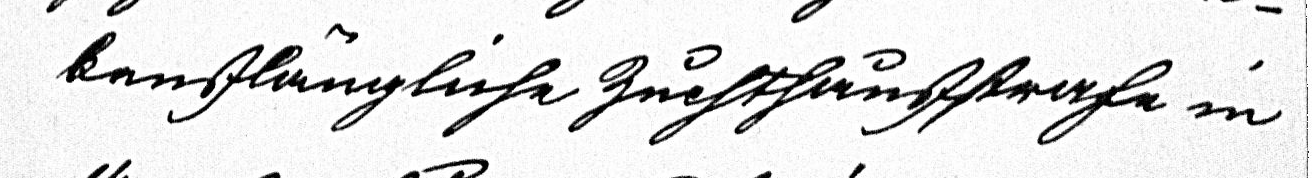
kanslängliche Zuchthausstrafe in
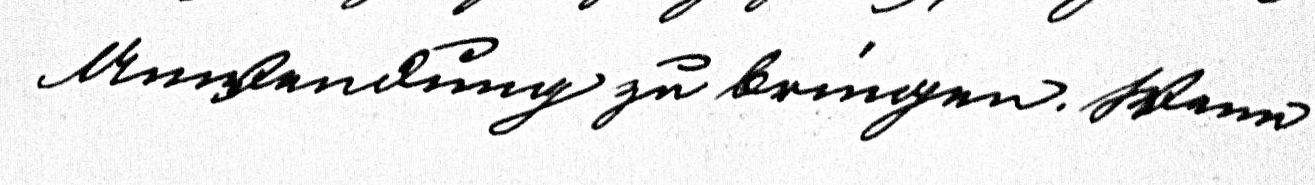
Anwendung zu bringen. Wenn
